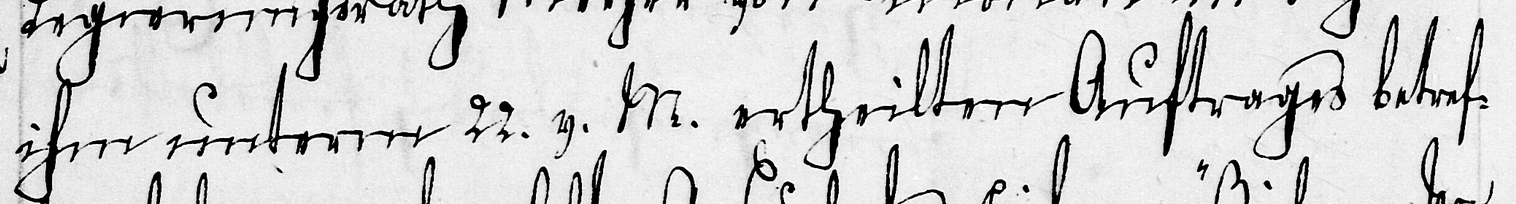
ihm unterm 22. v. M. ertheilten Auftrages betref¬
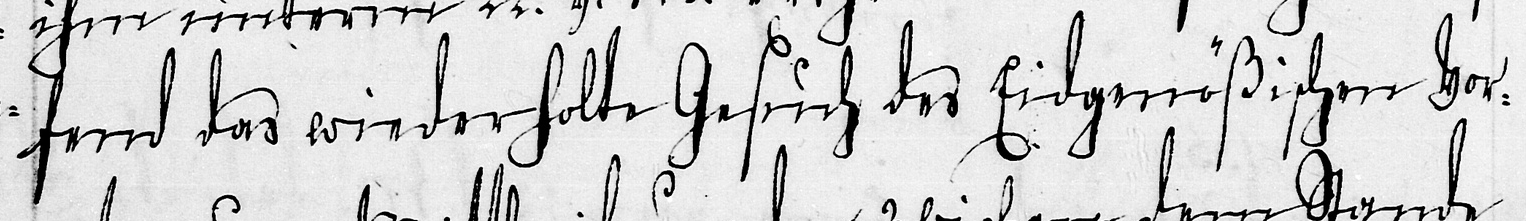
fend das wiederholte Gesuch des Eidgenößischen Vor¬
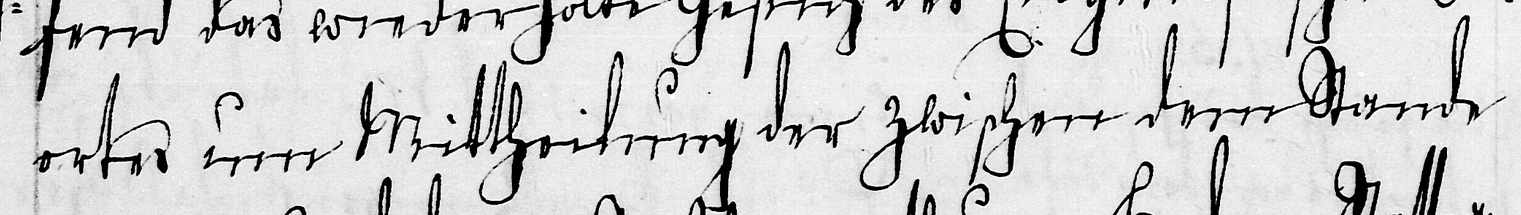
ortes um Mittheilung der zwischen dem Stande
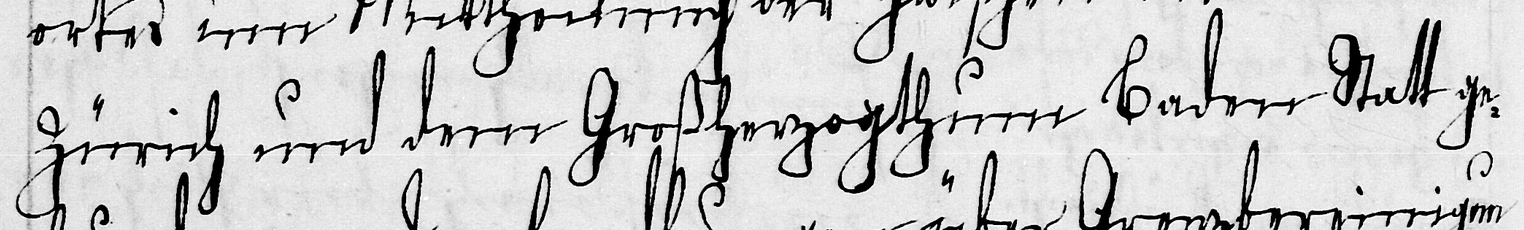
Zürich und dem Großherzogthum Baden Statt g¬
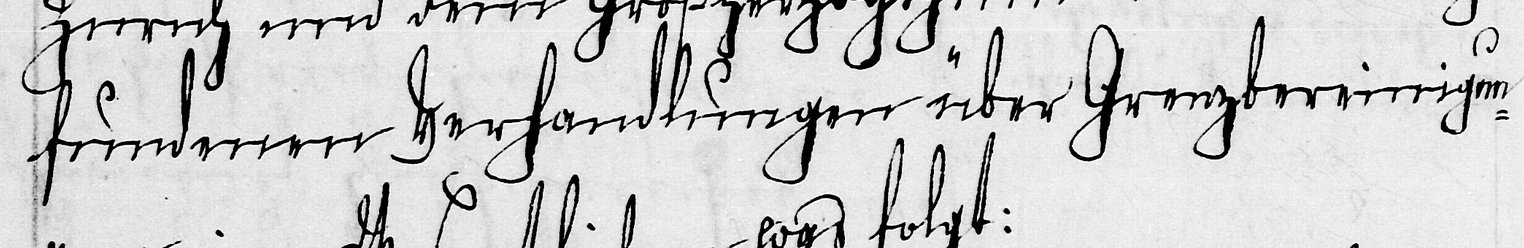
efundenen Verhandlungen über Grenzbereinigun¬
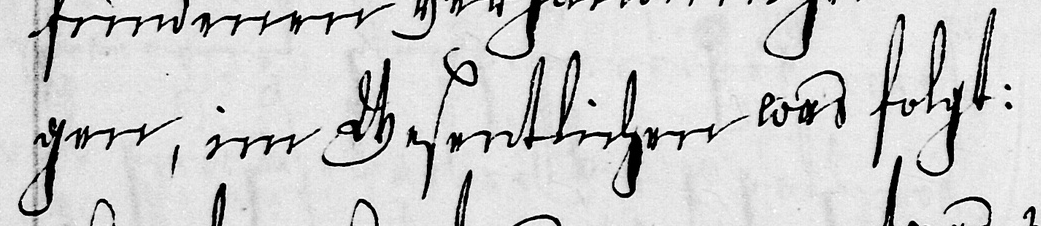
gen, im Wesentlichen was folgt:
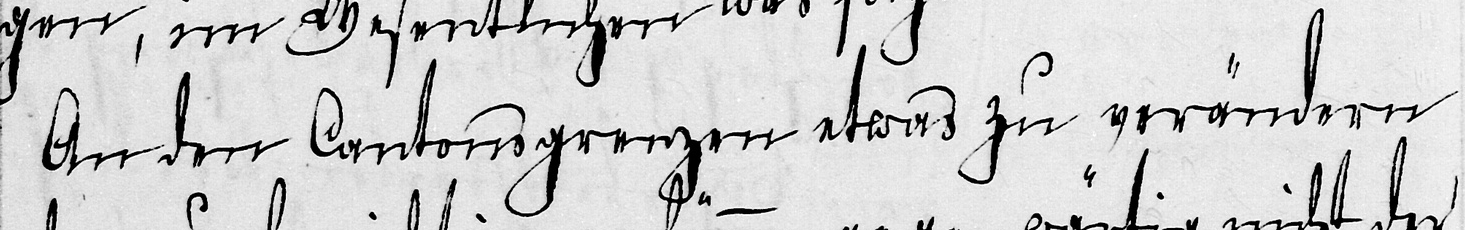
An den Cantonsgrenzen etwas zu verändern
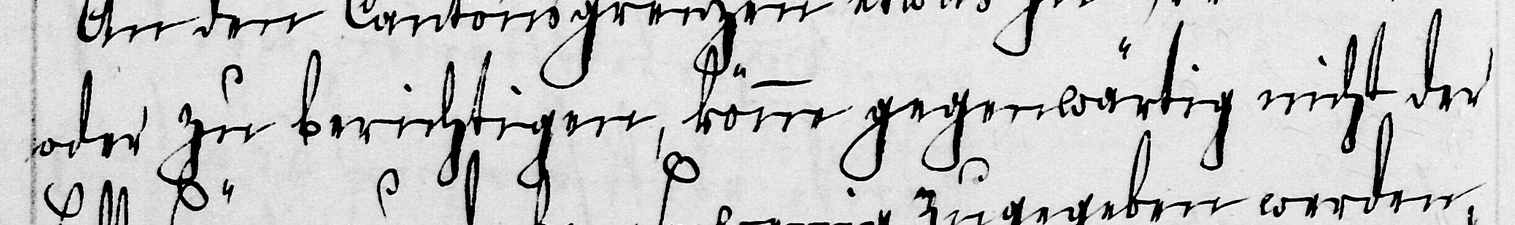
oder zu berichtigen, könne gegenwärtig nicht der
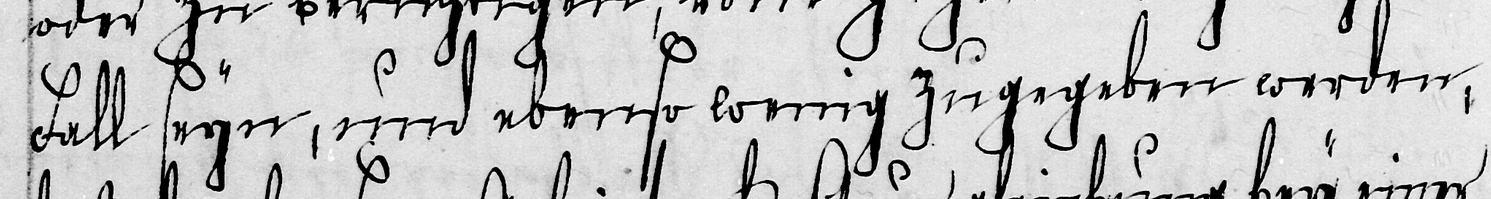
Fall seyn, und ebenso wenig zugegeben werden,
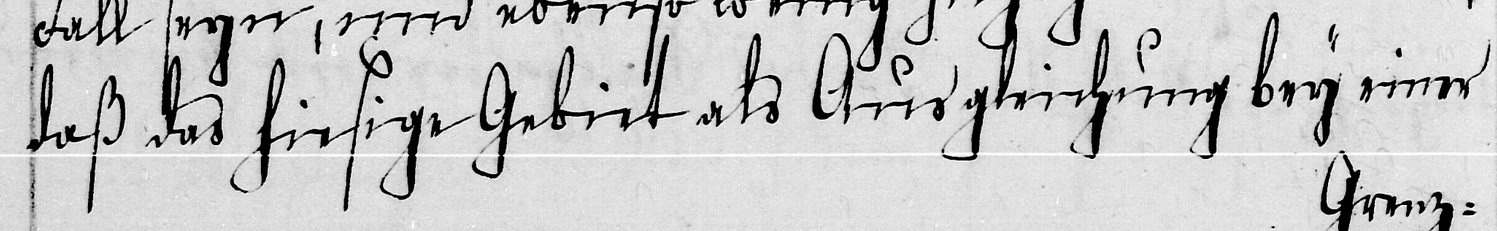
daß das hiesige Gebiet als Ausgleichung bey einer
